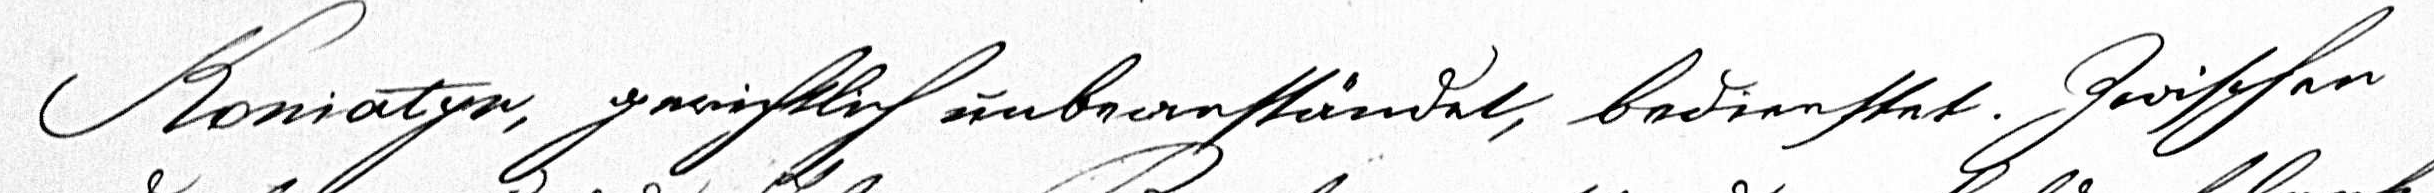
Koniatyn, gerichtlich unbeanständet, bedienstet. Zwischen
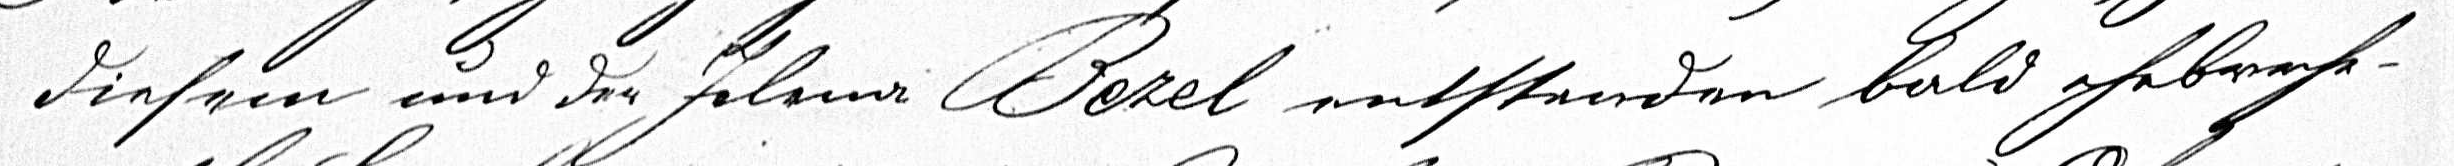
diesem und der Jelena Bezel entstanden bald ehebreche¬
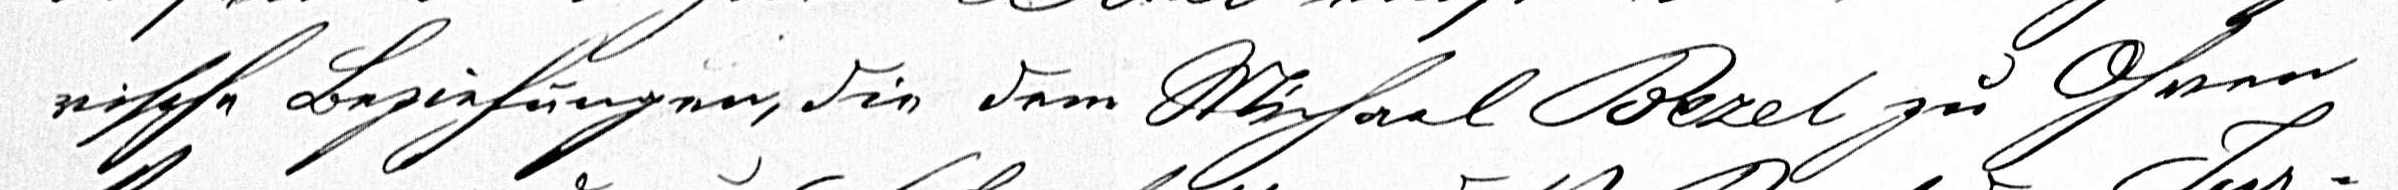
rische Beziehungen, die dem Michael Bezel zu Ohren
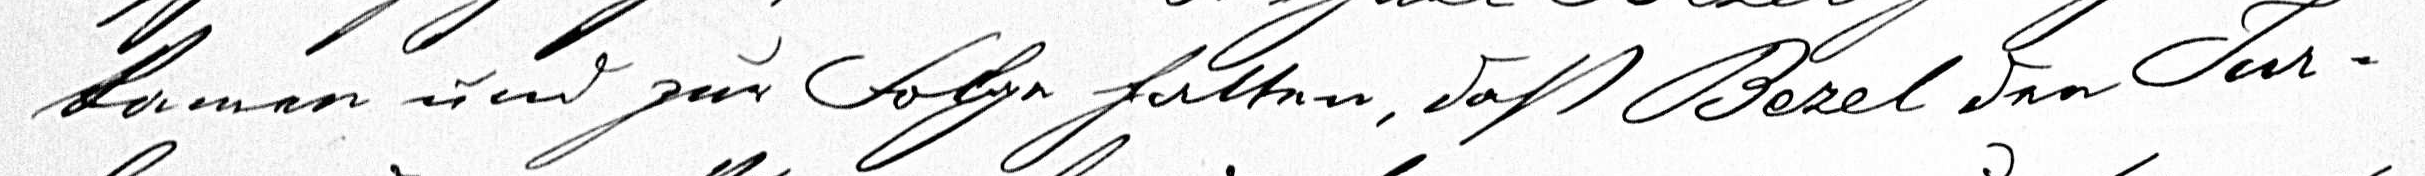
kamen und zur Folge hatten, daß Bezel den Iur¬
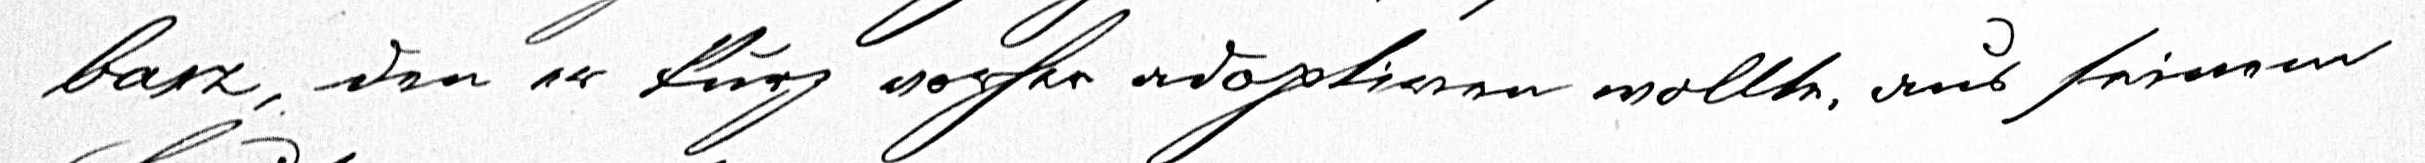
basz, den er kurz vorher adoptiren wollte, aus seinem
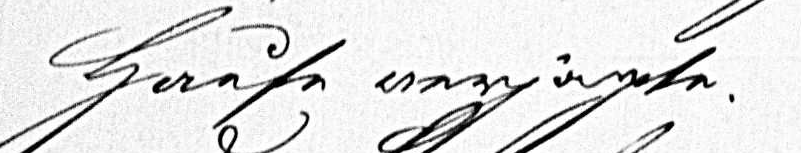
Hause verjagte.
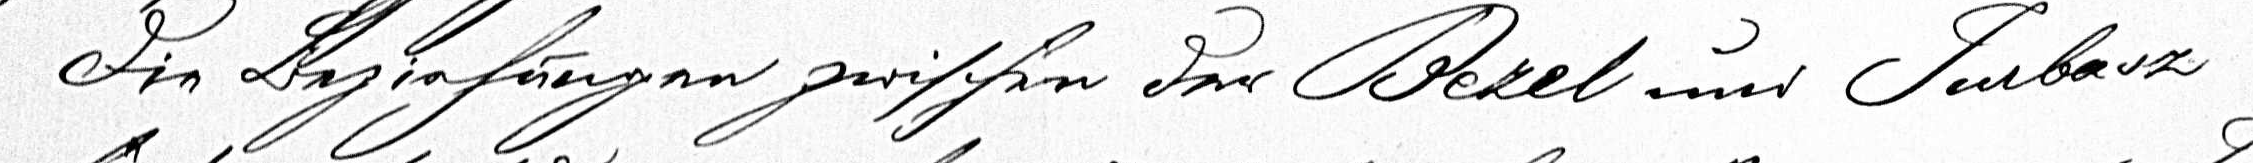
Die Beziehungen zwischen der Bezel und Iurbasz
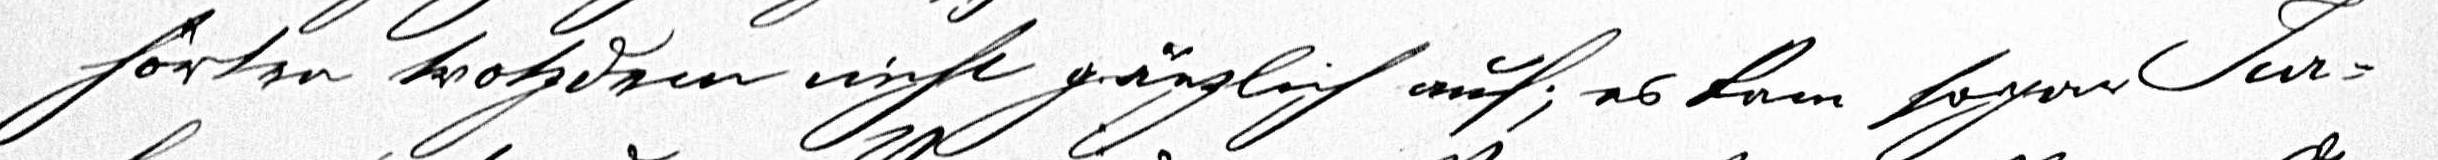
hörten trotzdem nicht gänzlich auf; es kam sogar Iur¬
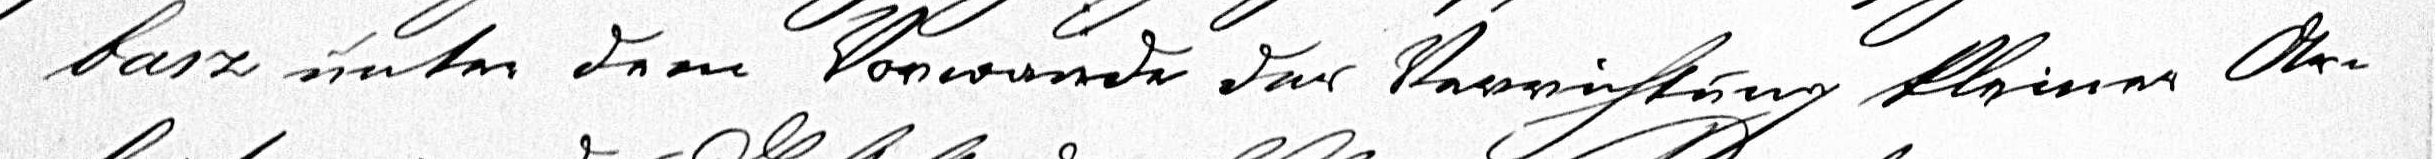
basz unter dem Vorwande der Verrichtung kleiner Ar¬
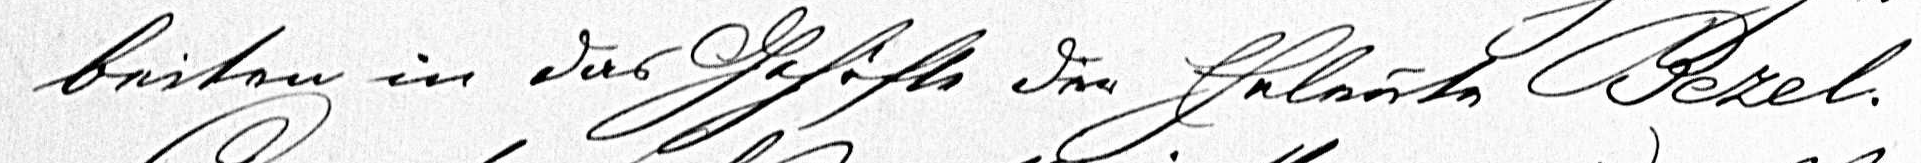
beiten in das Gehöfte der Eheleute Bezel.
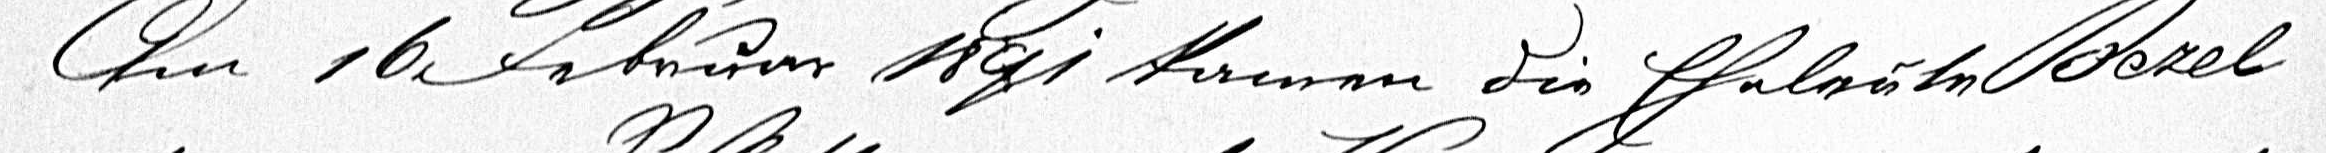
Am 16. Februar 1891 kamen die Eheleute Bezel
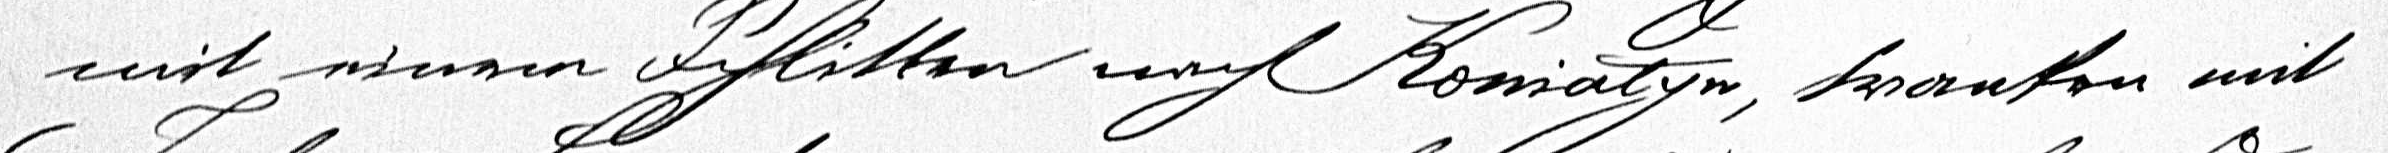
mit einem Schlitten nach Koniatyn, tranken mit
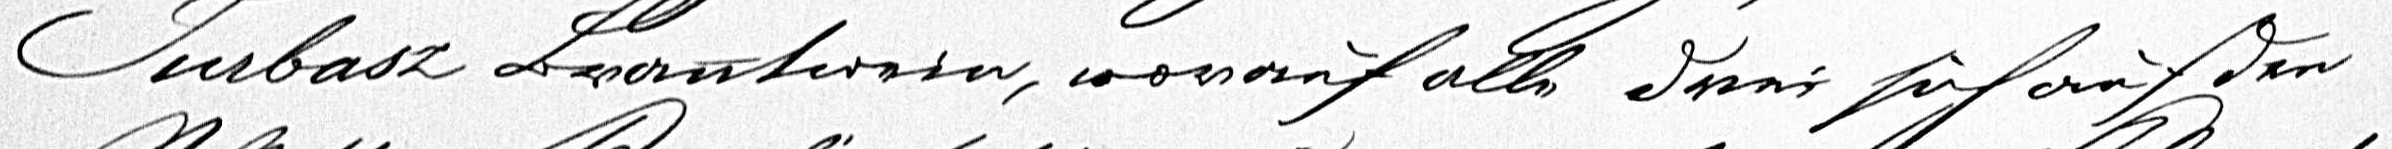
Iurbasz Branntwein, worauf alle drei sich auf den
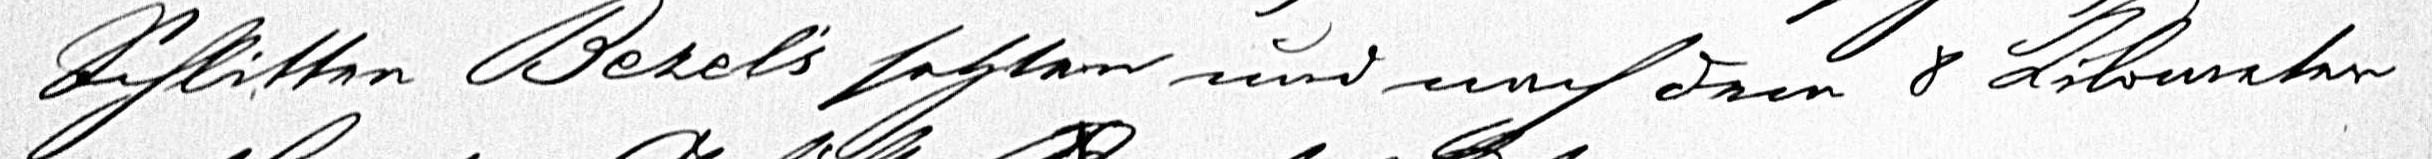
Schlitten Bezel’s setzten und nach dem 8 Kilometer
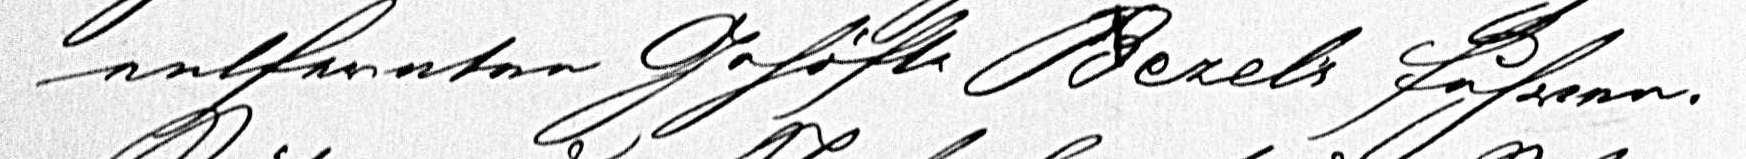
entfernten Gehöfte Bezels fuhren.
